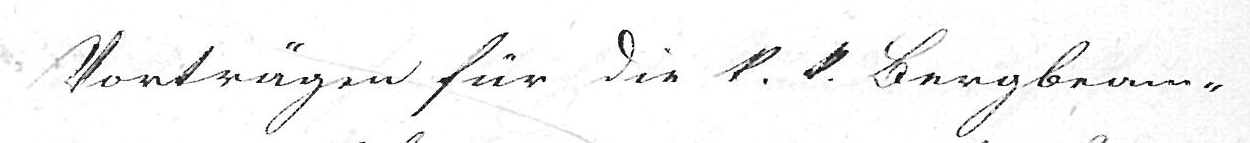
Vorträgen für die k. k. Bergbeam-
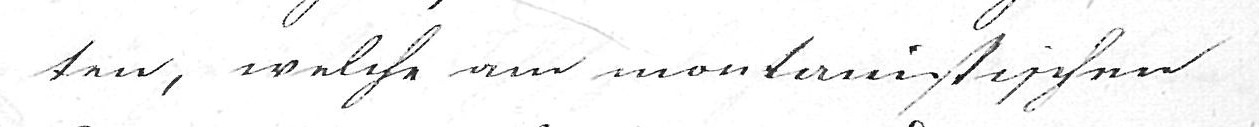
ten, welche am montanistischen
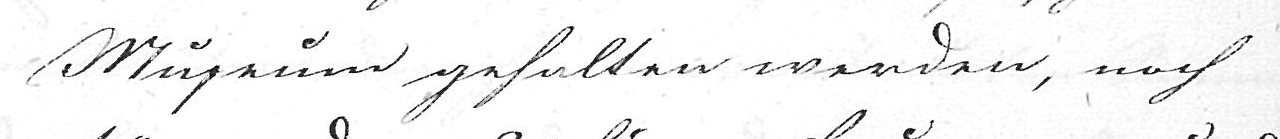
Museum gehalten werden, noch
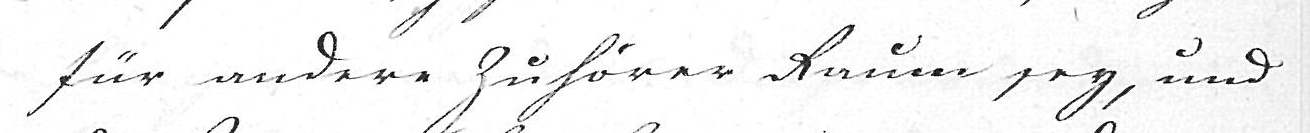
für andere Zuhörer Raum sey, und
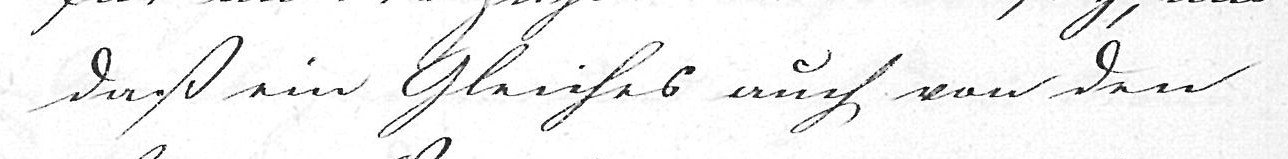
daß ein Gleiches auch von den
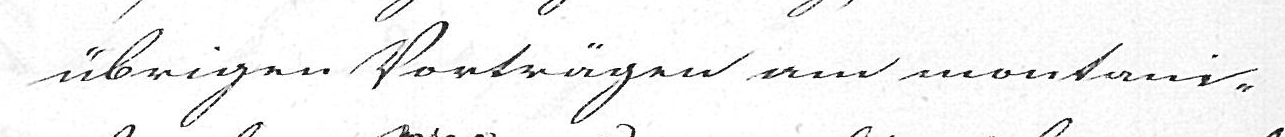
übrigen Vorträgen am montani-
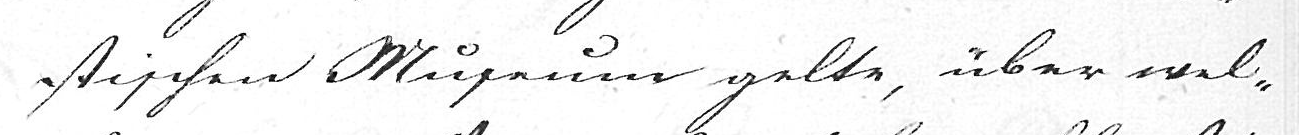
stischen Museum gelte, über wel-
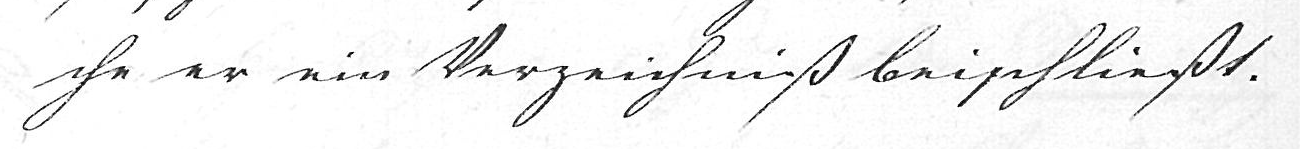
che er ein Verzeichniß beischließt.
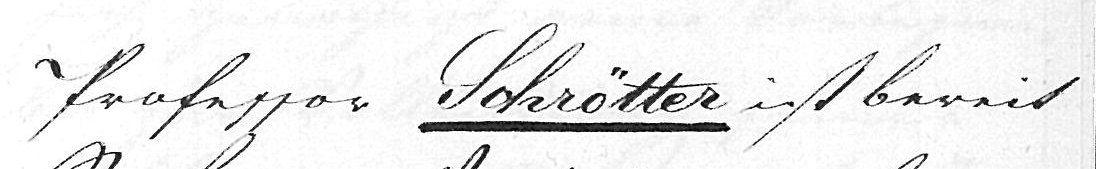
Professor Schrötter bereit
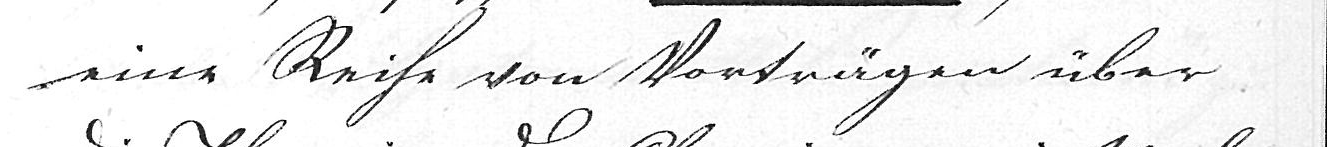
eine Reihe von Vorträgen über
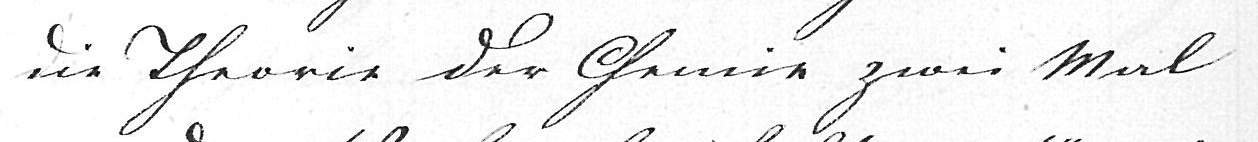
in Theorie der Chemie zwei Mal
